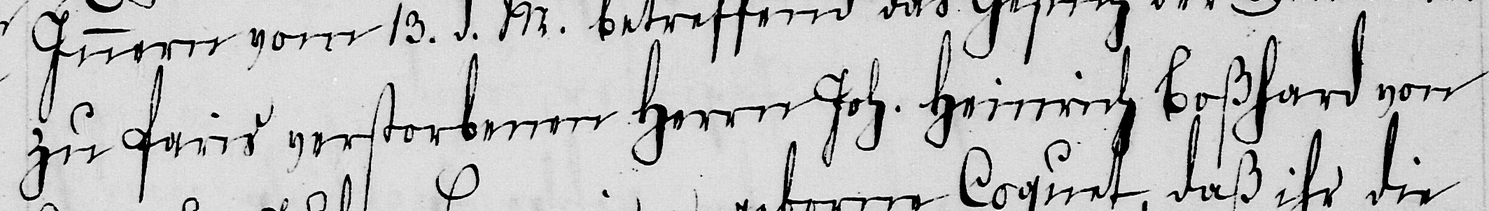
zu Paris verstorbenen Herrn Joh. Heinrich Boßhard von
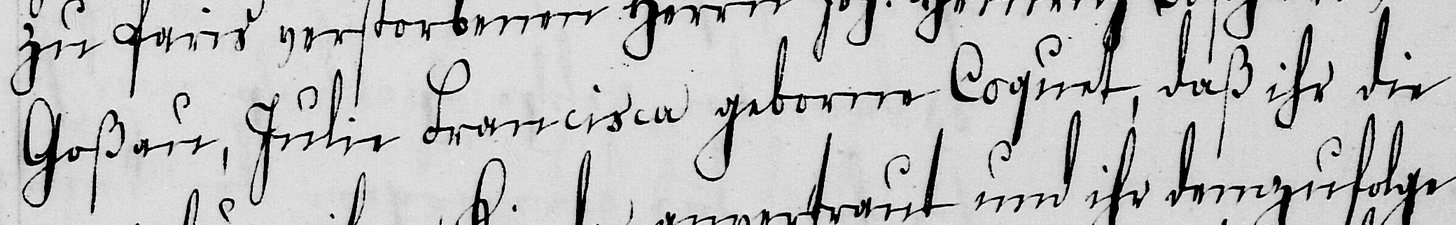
Goßau, Julia Francisca geborene Coquat, daß ihr die
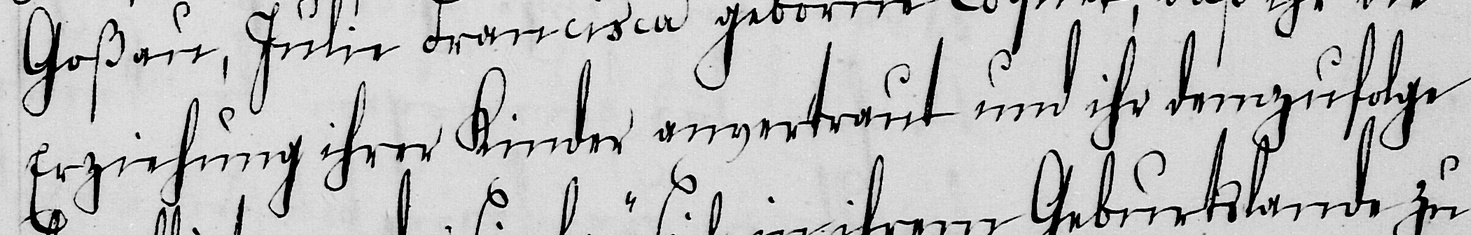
Erziehung ihrer Kinder anvertraut und ihr demzufolge
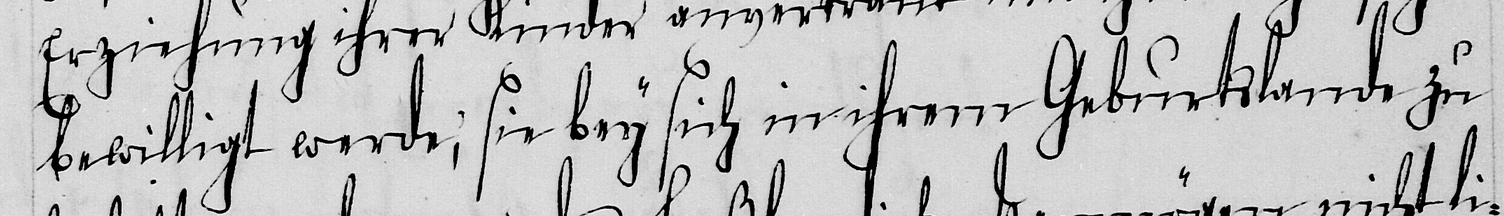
bewilligt werde; sie bey sich in ihrem Geburtslande zu
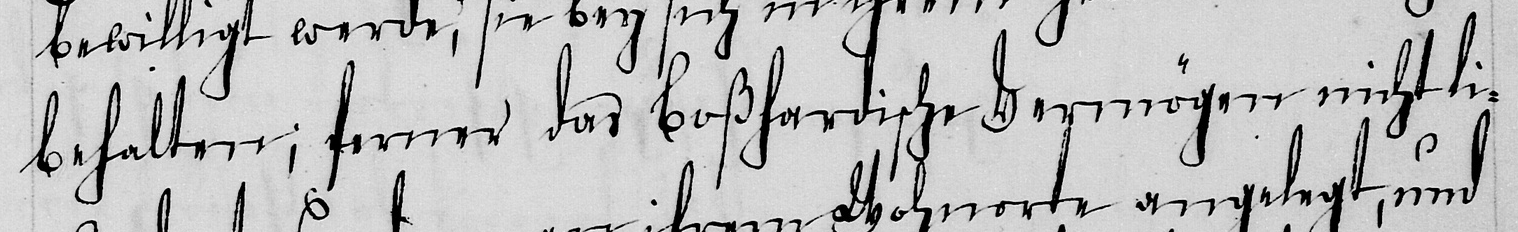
behalten; ferner das Boßhardische Vermögen nicht li¬
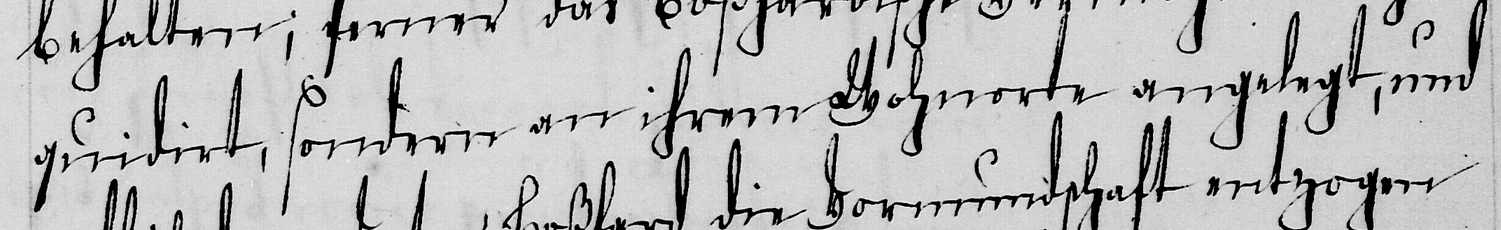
quidiert, sondern an ihrem Wohnorte angelegt, und
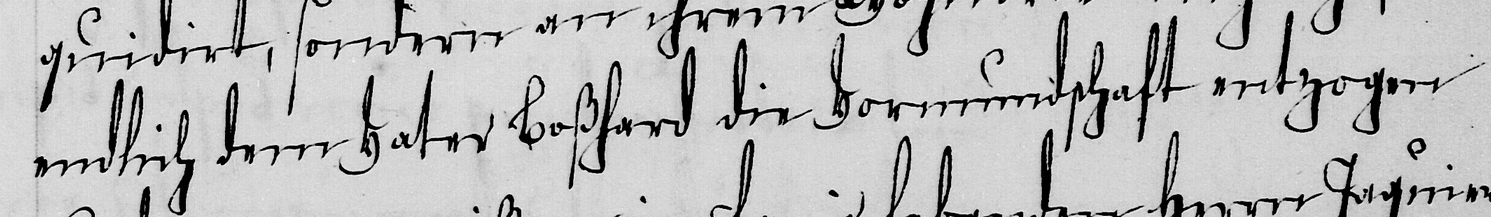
endlich dem Vater Boßhard die Vormundschaft entzogen
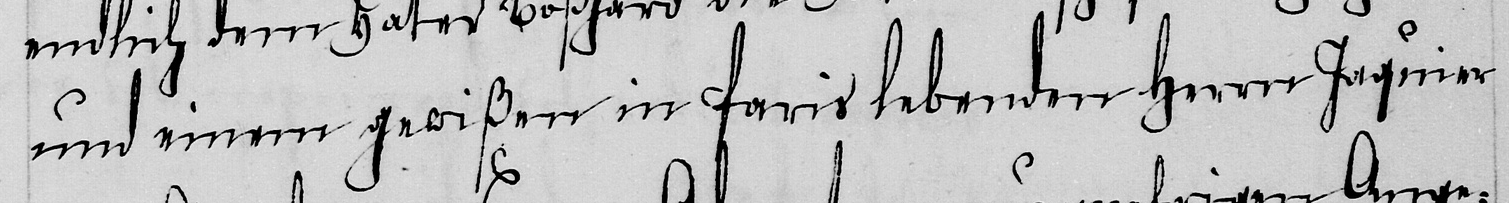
und einen gewißen in Paris lebenden Herrn Jaquier
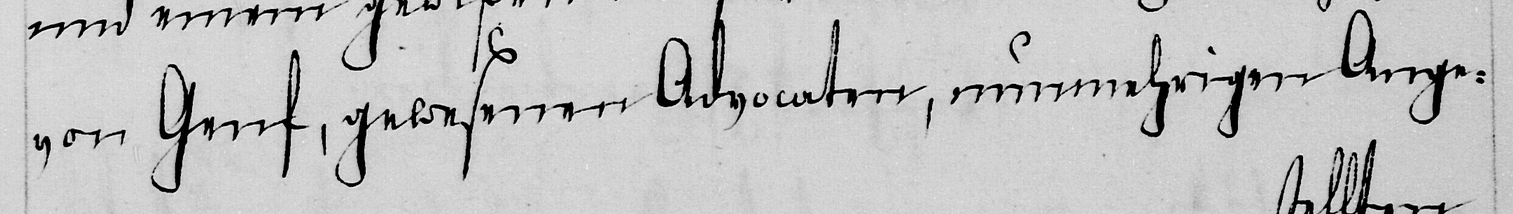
von Genf, gewesenen Advocaten, nunmehrigen Ange-
